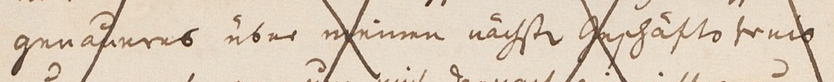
genaueres über meinen nächsten Geschäftskreis
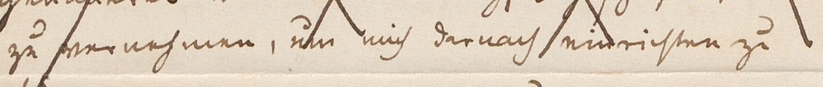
zu vernehmen, um mich darauf einrichten zu
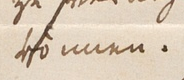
können.
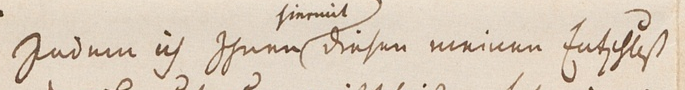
Indem ich Ihnen hiermit diesen meinen Entschluß
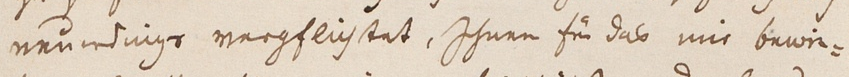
neuerdings verpflichtet, Ihnen für das mir bewie-
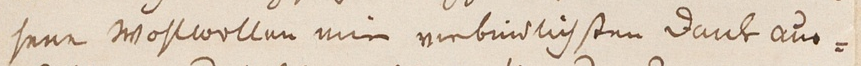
sene Wohlwollen meinen verbindlichsten Dank aus-
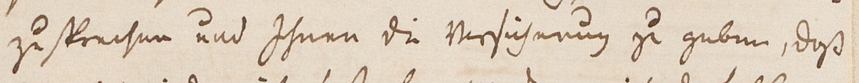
zusprechen und Ihnen die Versicherung zu geben, daß
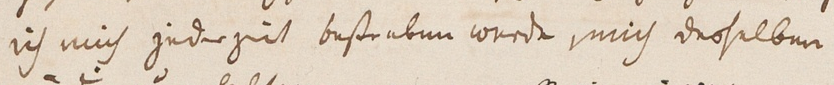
ich mich jederzeit bestreben werde, mich derselben
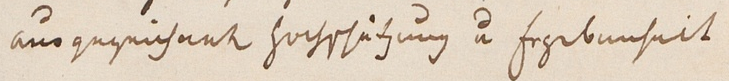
ausgezeichneten Hochschätzung u Ergebenheit
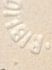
J.
